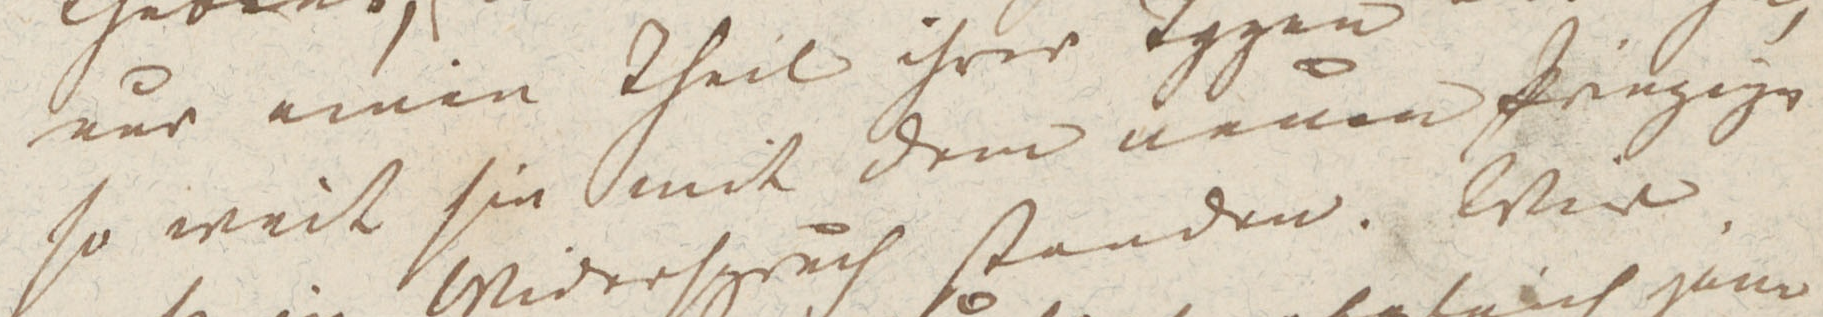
so weit sie mit dem neuen Prinzipe
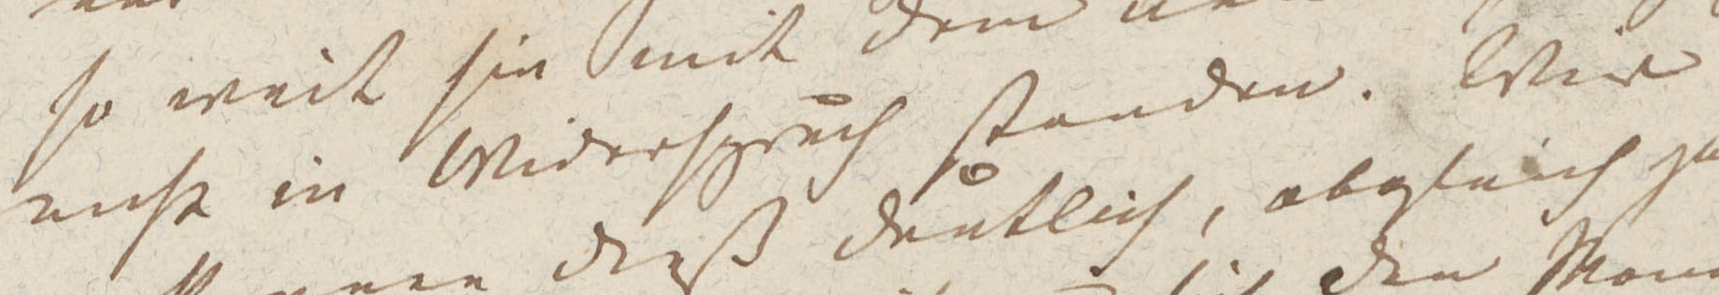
nicht in Widerspruch standen. Wir
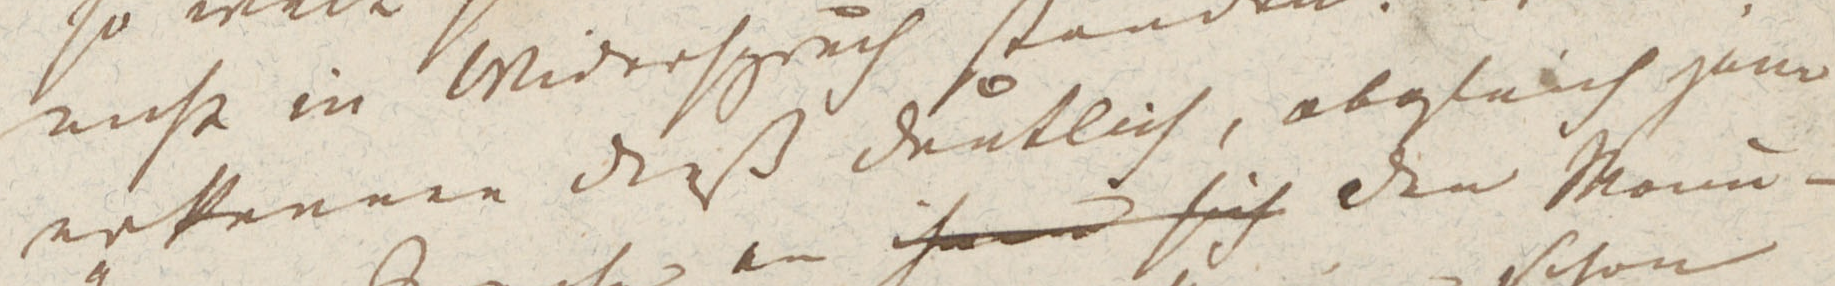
erkennen diess deutlich, obgleich jene
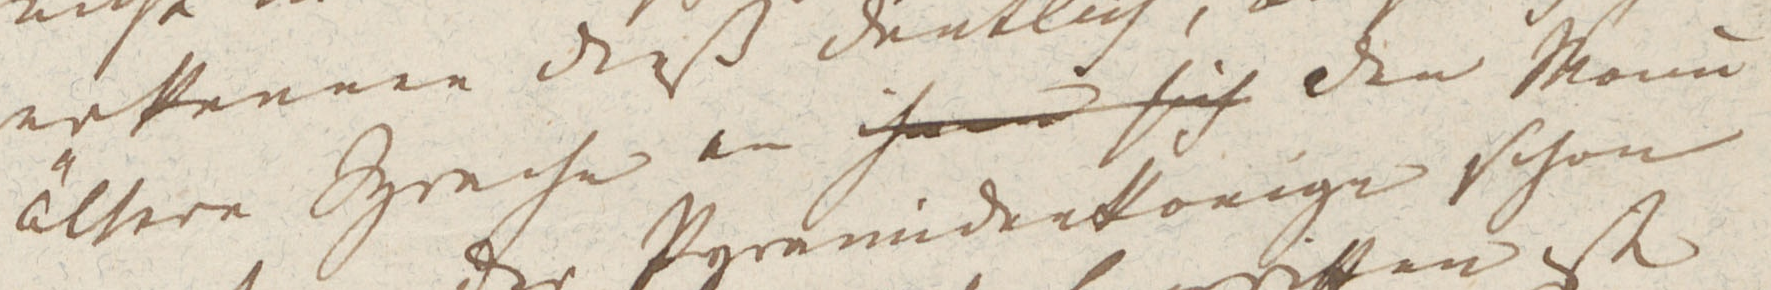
ältere Sprache an ihnen sich den Monu-
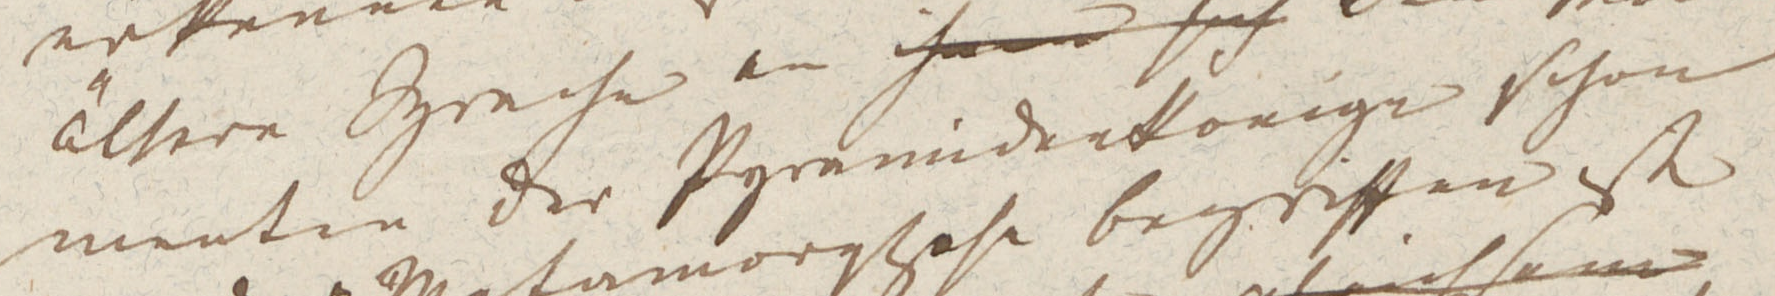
menten der Pyramidenkonige schon
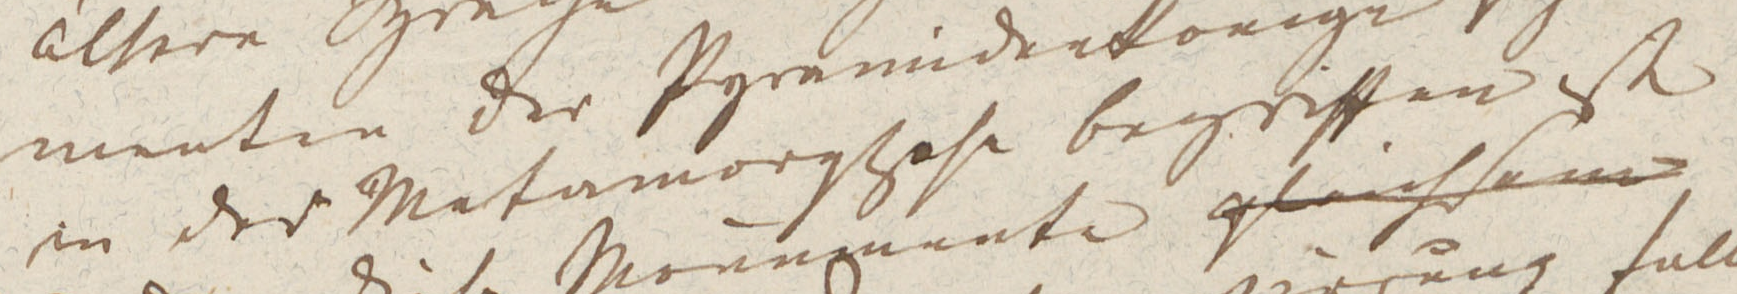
in der Metamorphose begriffen ist
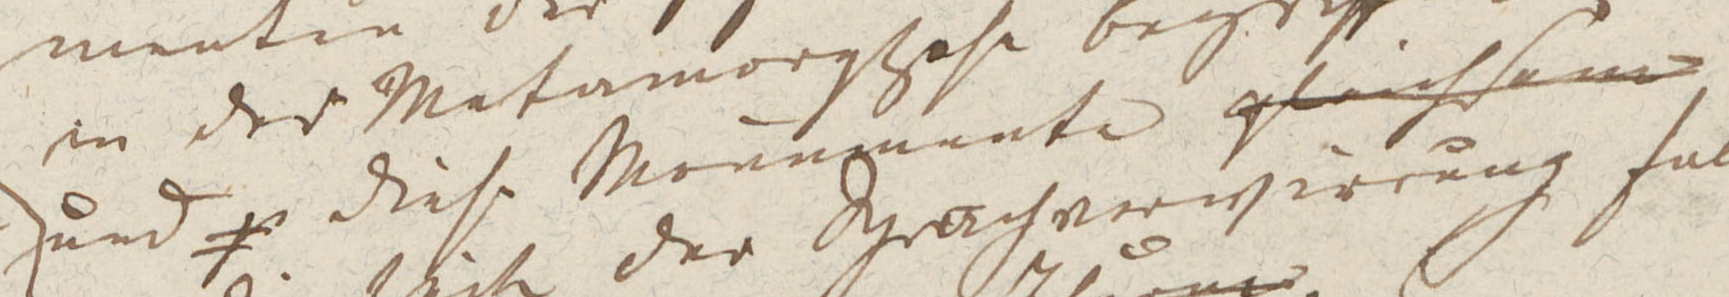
und diese Monumente gleichsam
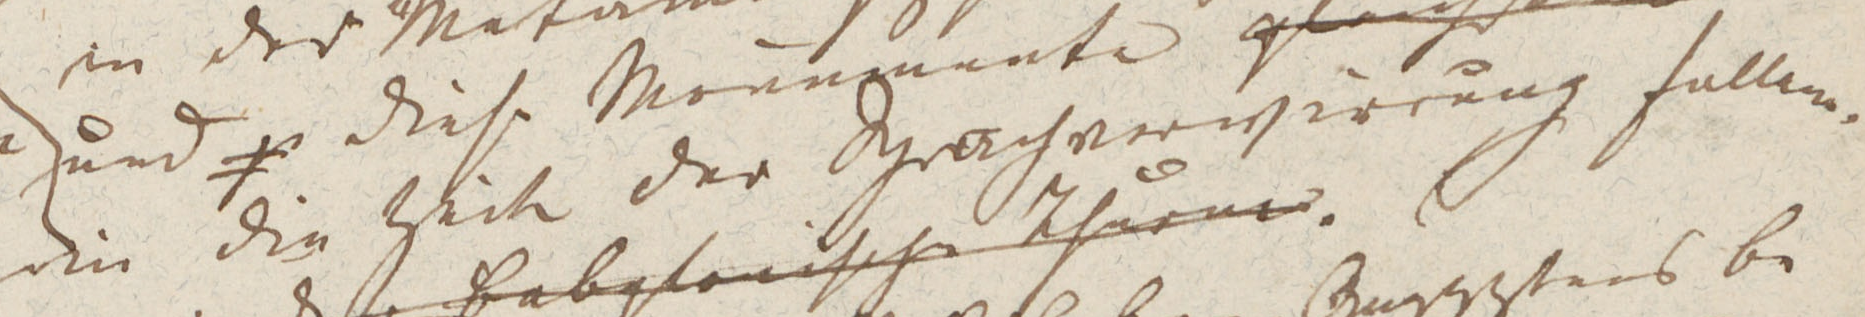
in die Zeit der Sprachverwirrung fallen.
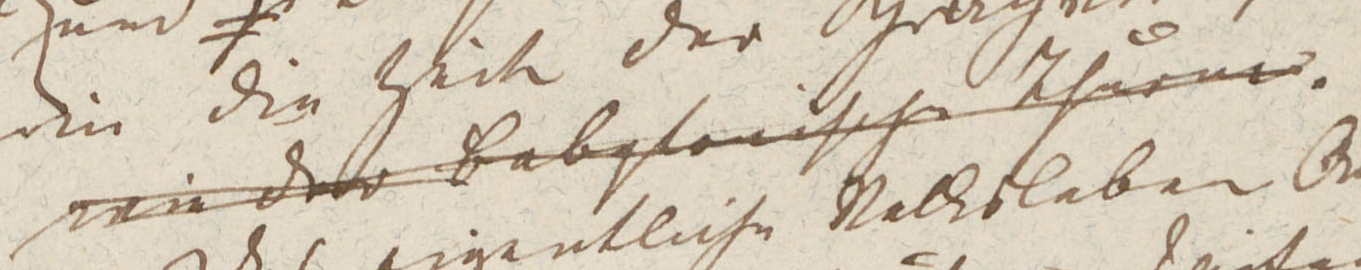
wie der Babylonische Thurm.
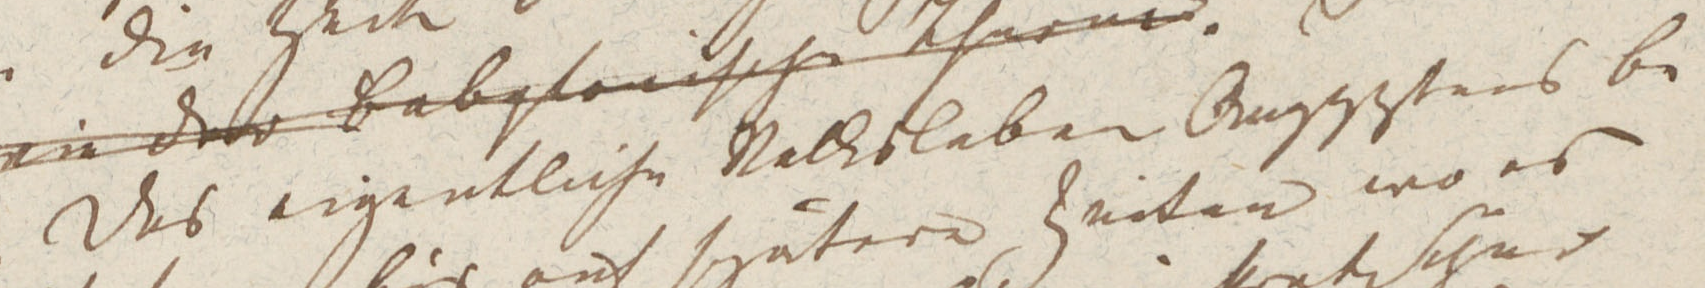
Das eigentliche Volksleben Aegyptens be
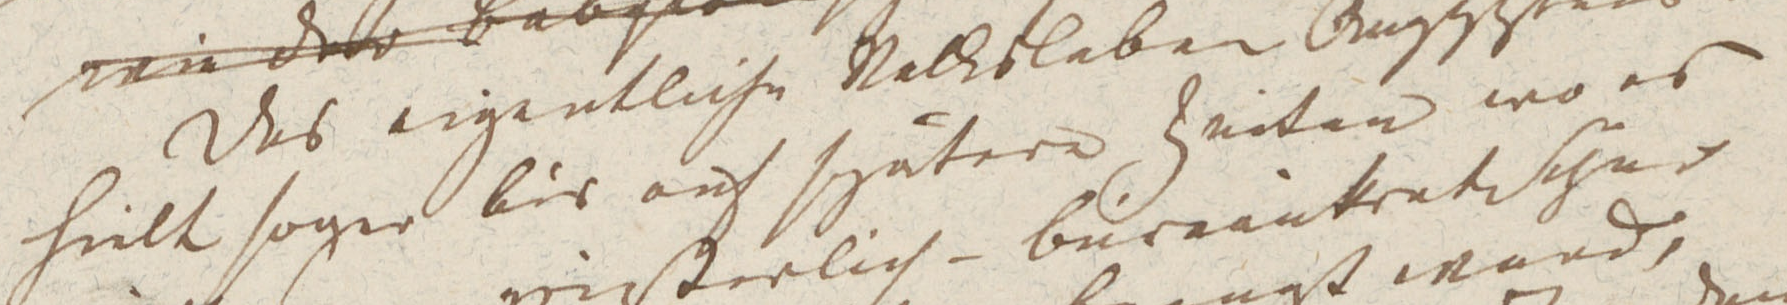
hielt sogar bis auf spätere Zeiten wo es
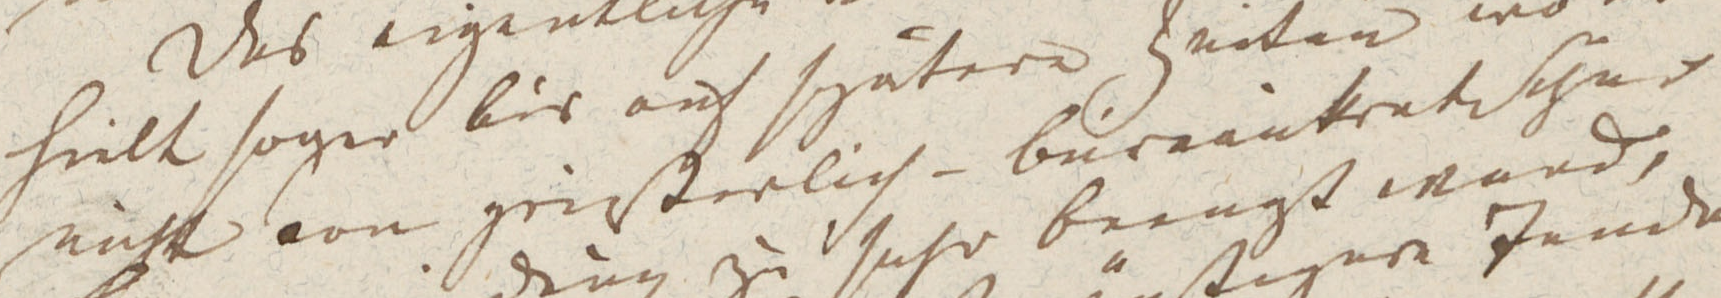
nicht von priesterlich-büreaukratischer
